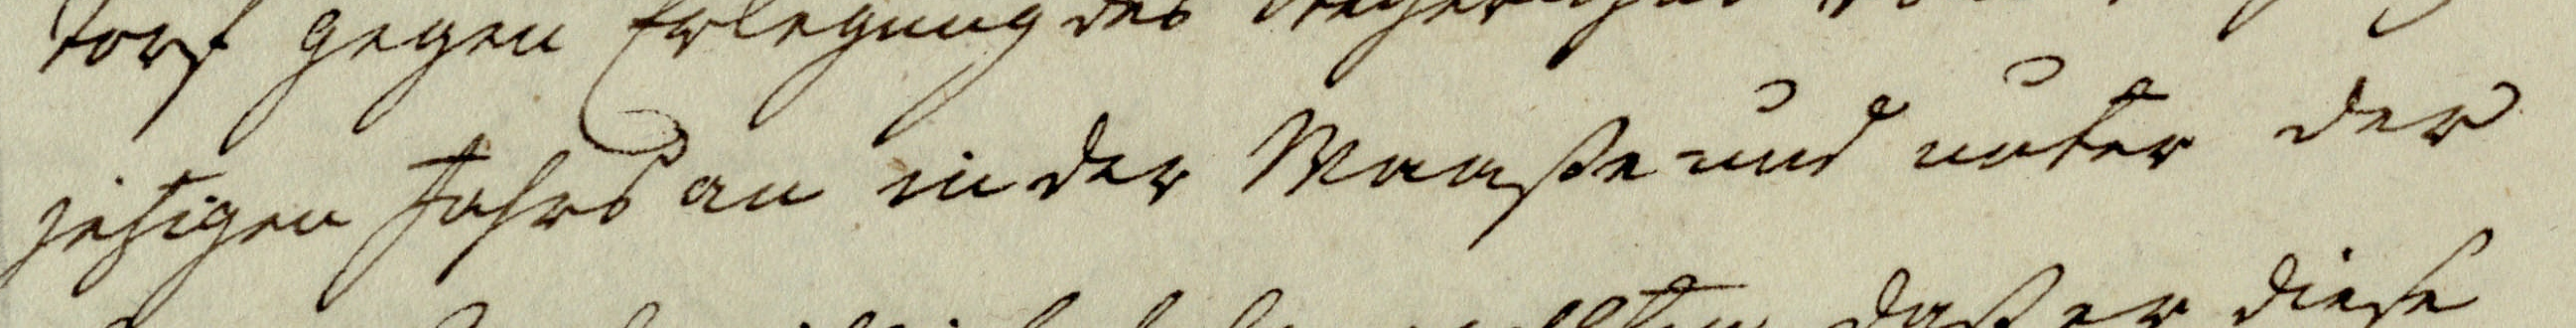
jetzigen Jahres an in der Maaße und unter der
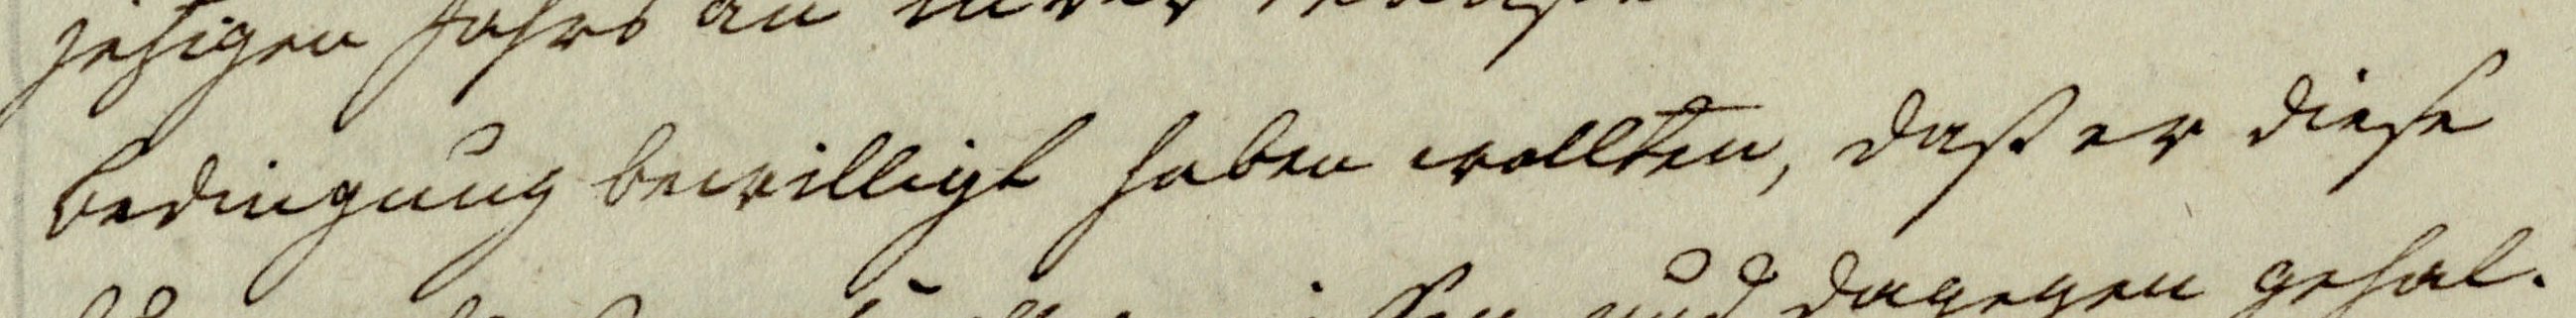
Bedingung bewilligt haben wollten, daß er diese
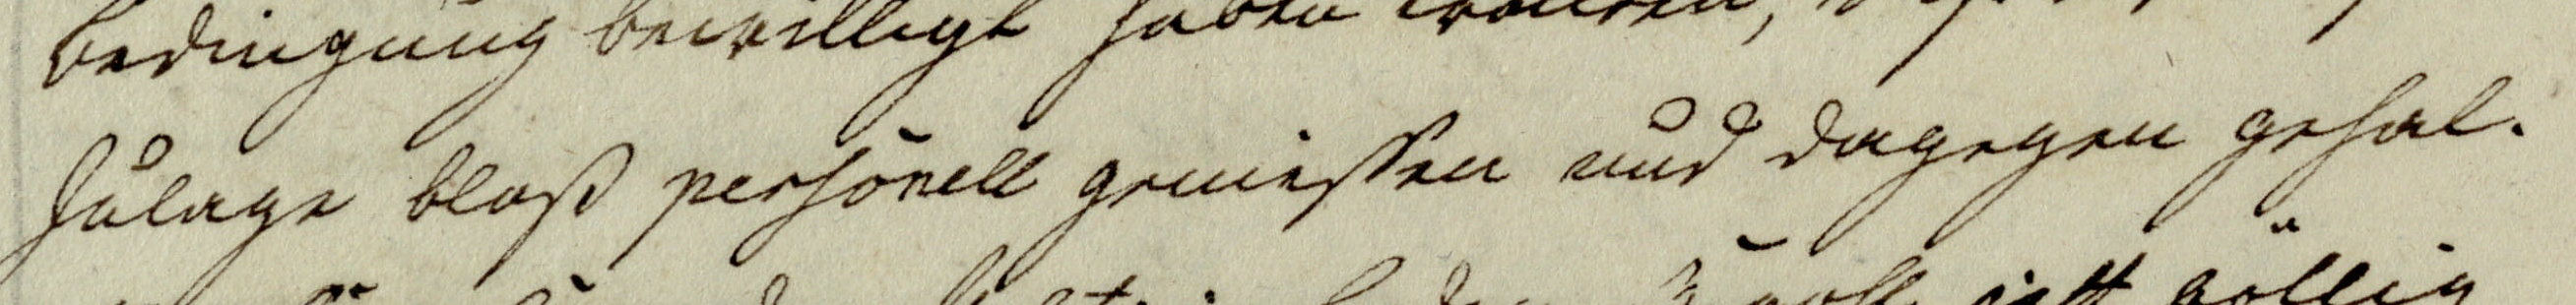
Zulage bloß personell geniessen und dagegen gehal-
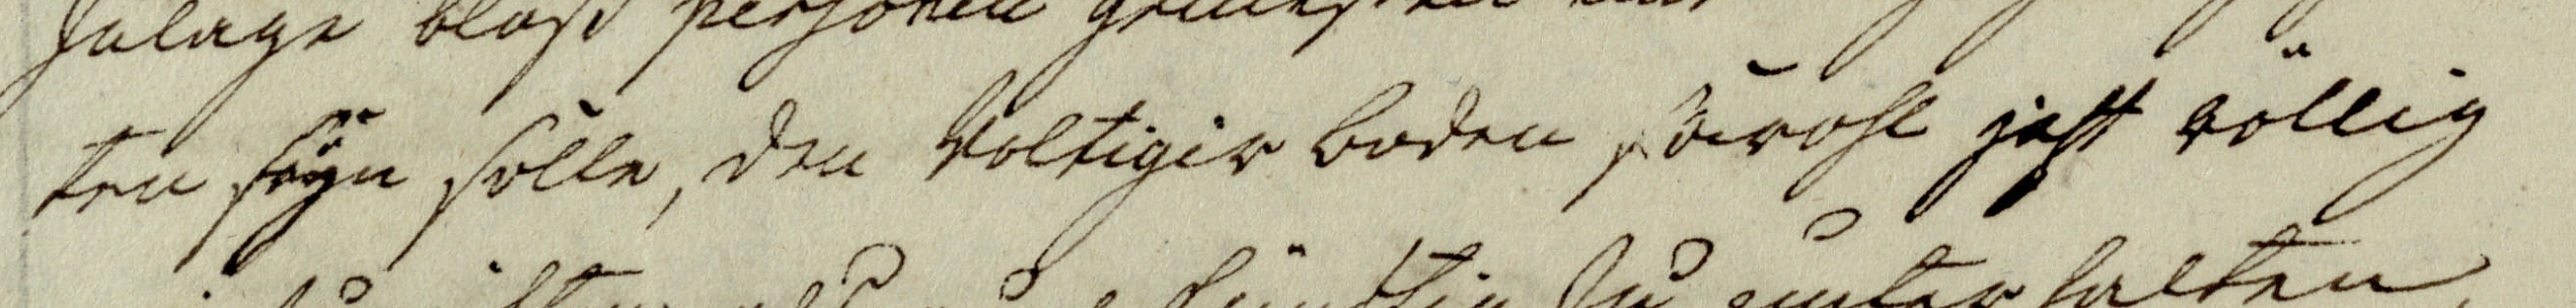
ten seÿn solle, den Voltigir Boden sowohl jetzt völlig
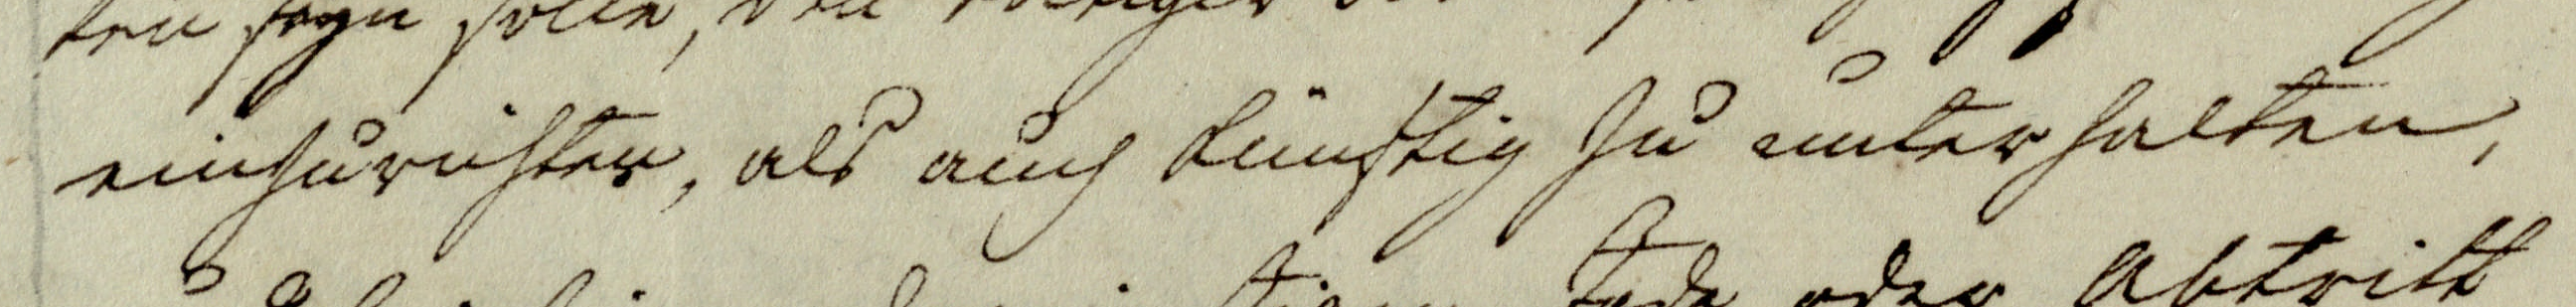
einzurichter, als auch künftig zu unterhalten,
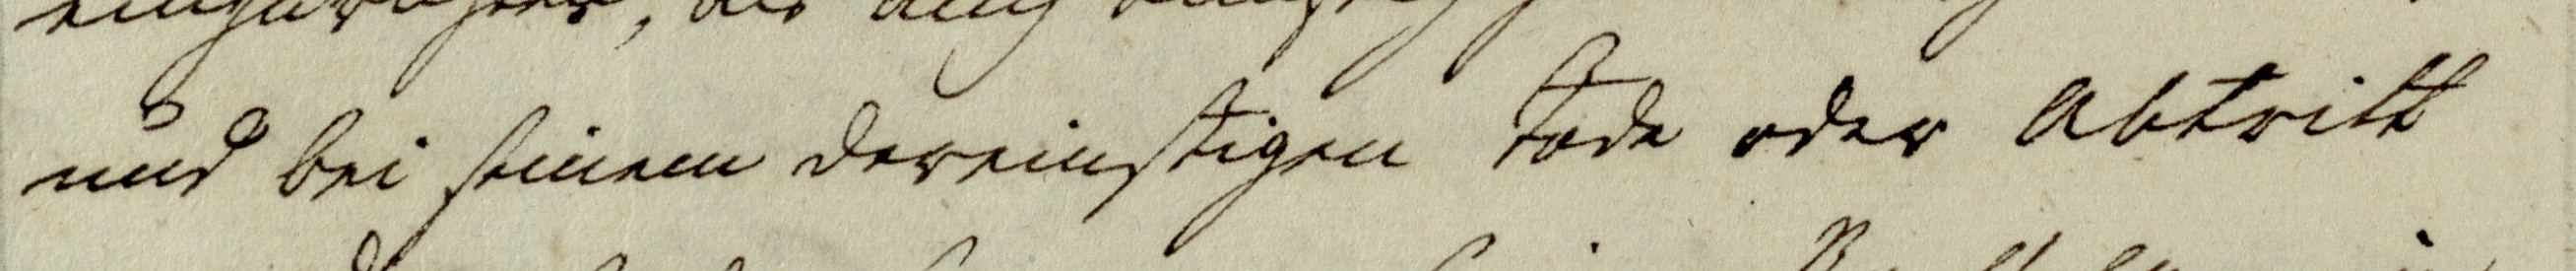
und bei seinem dereinstigen Tode oder Abtritt
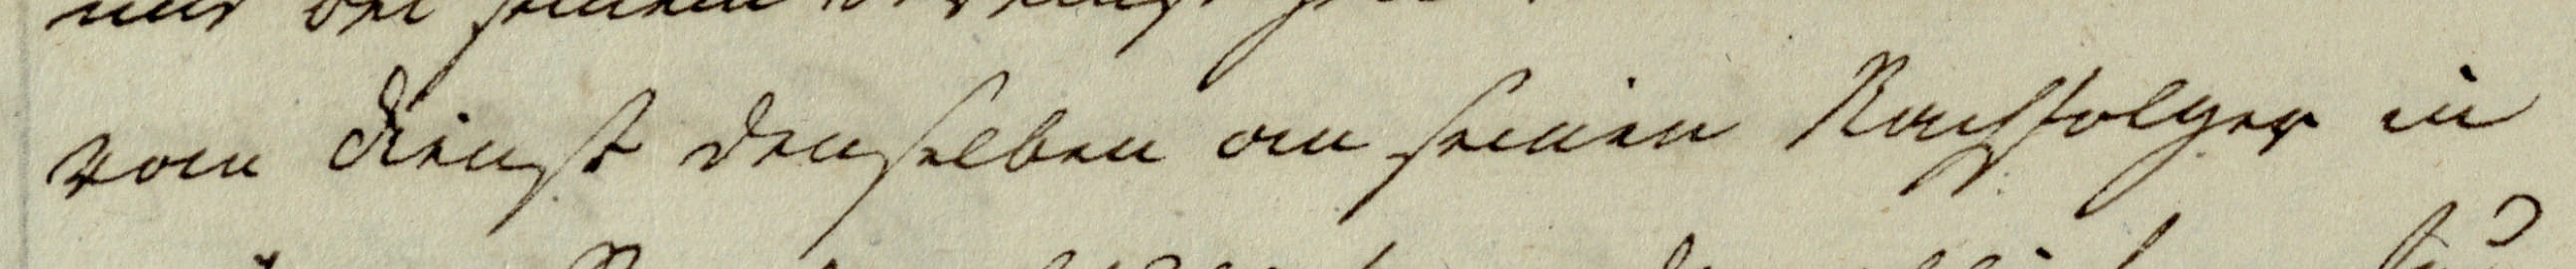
vom Dienst denselben an seinen Nachfolger in
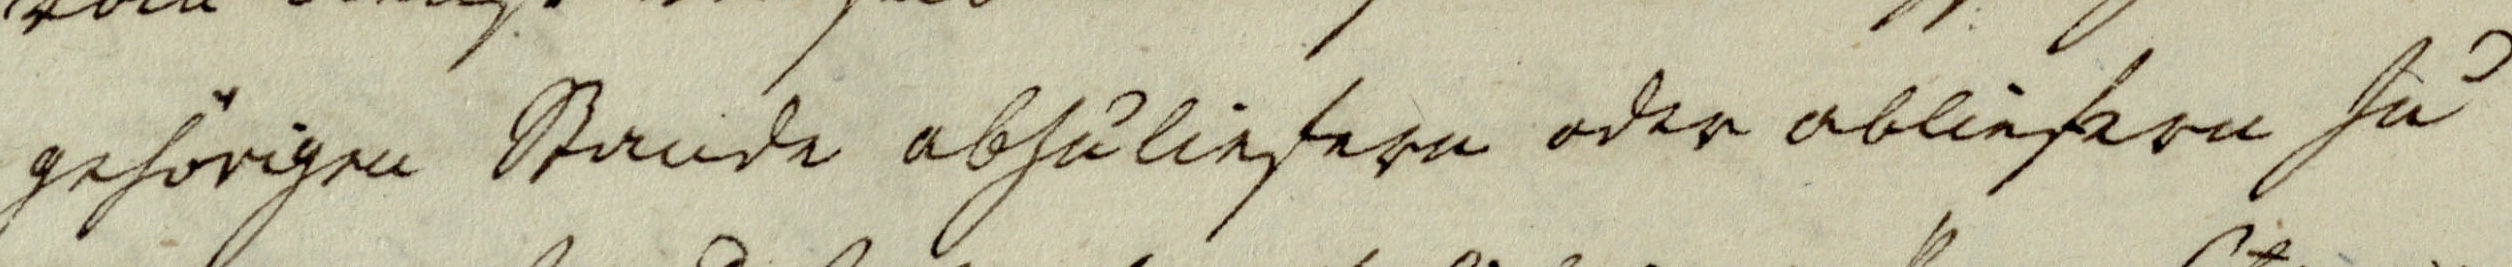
gehörigen Stande abzuliefern oder abliefern zu
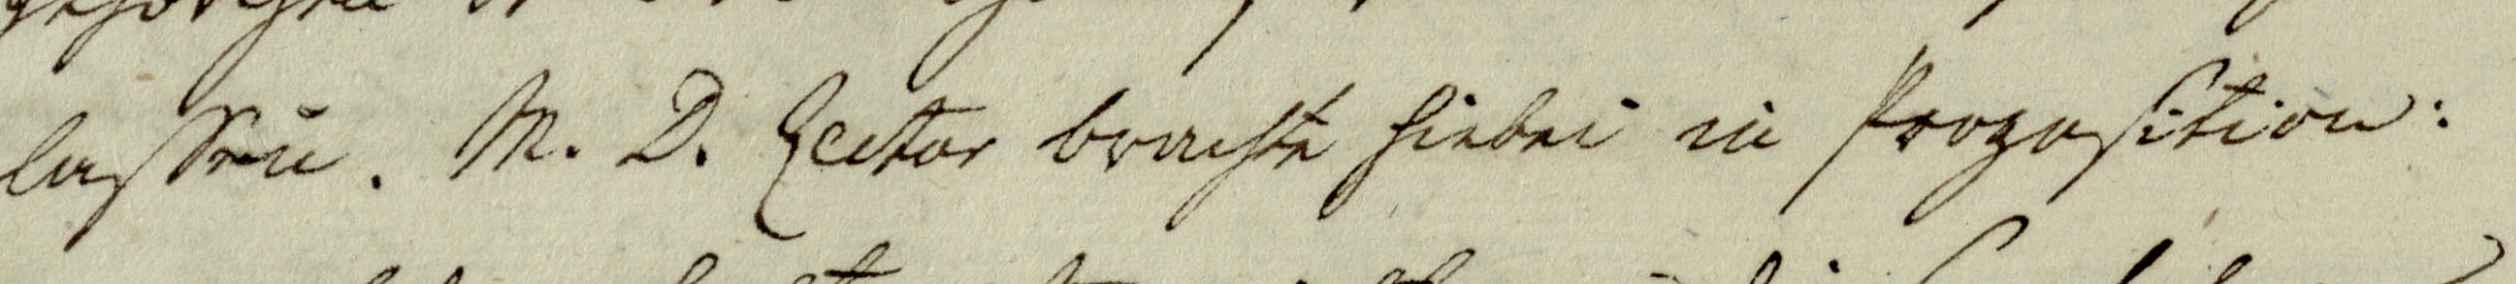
lassen. M. D. Rector brachte hiebei in Proposition:
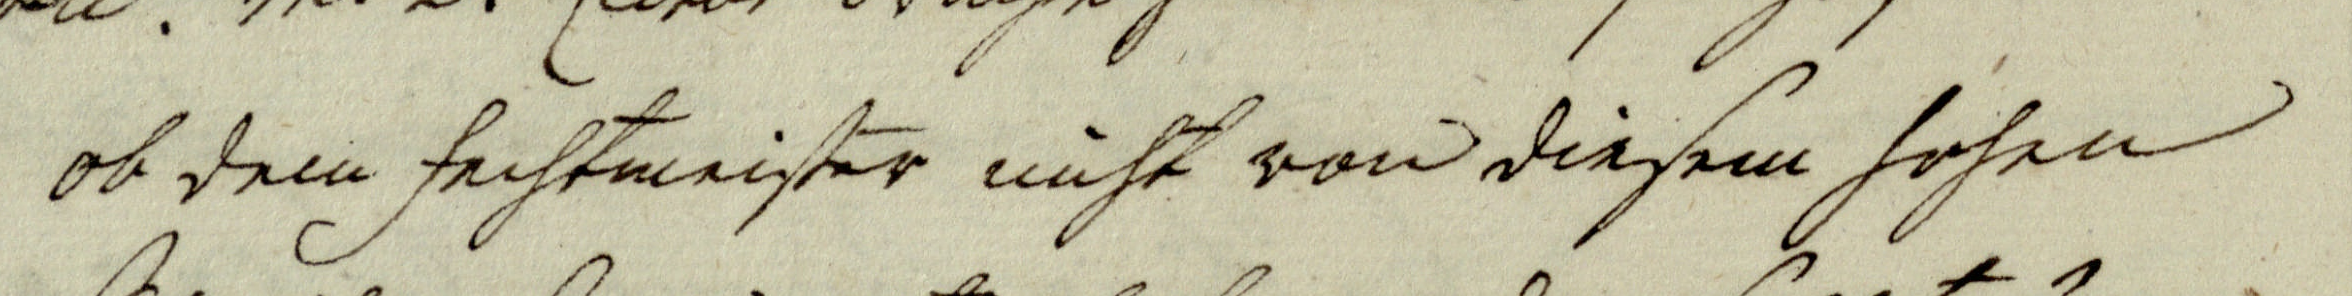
ob dem Fechtmeister nicht von diesem hohen
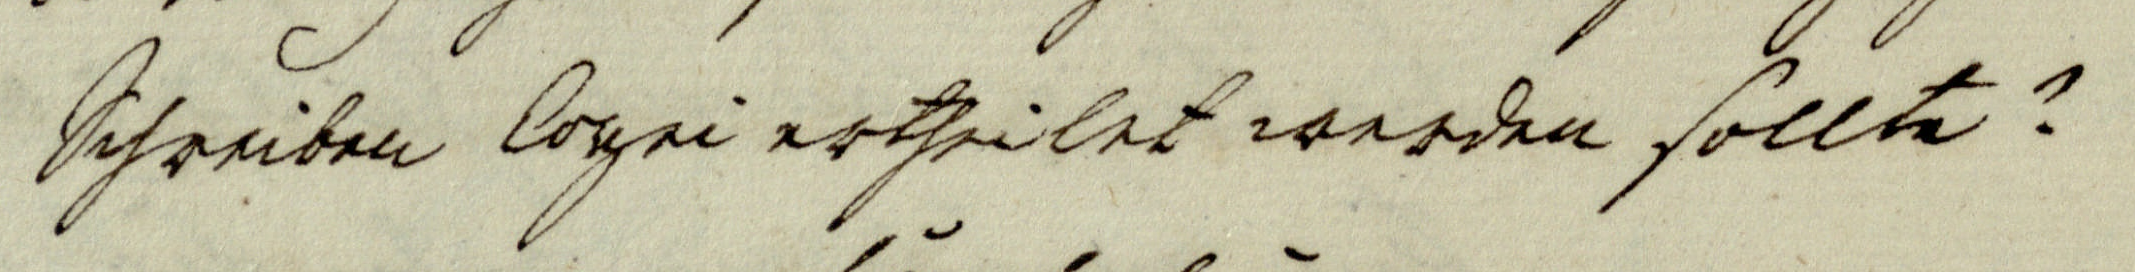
Schreiben Copei ertheilet werden sollte?
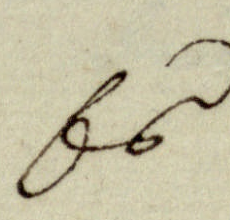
Es
